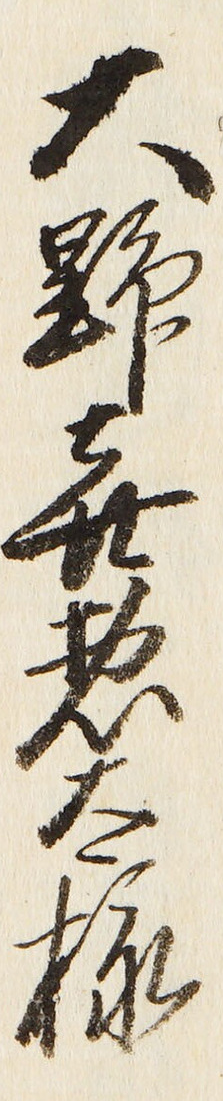大野喜惣太様
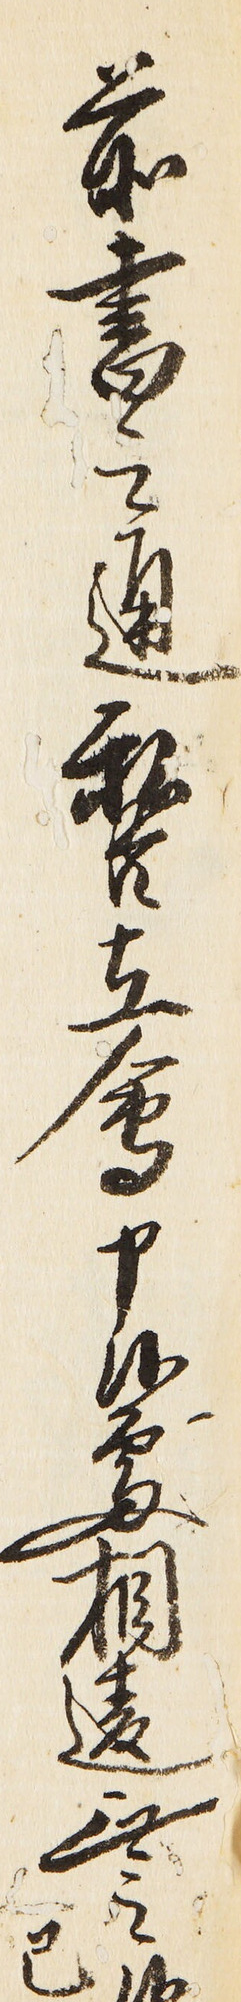前書之通私共立合申候処相違無之候已上
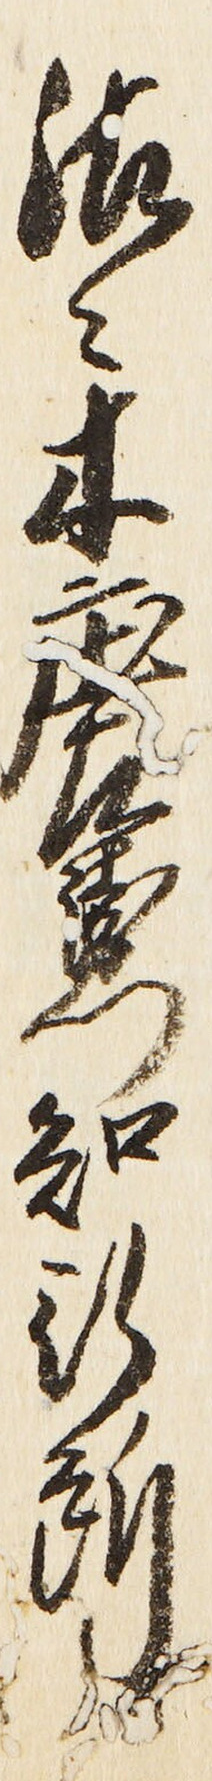佐々木庄左衛門知行所
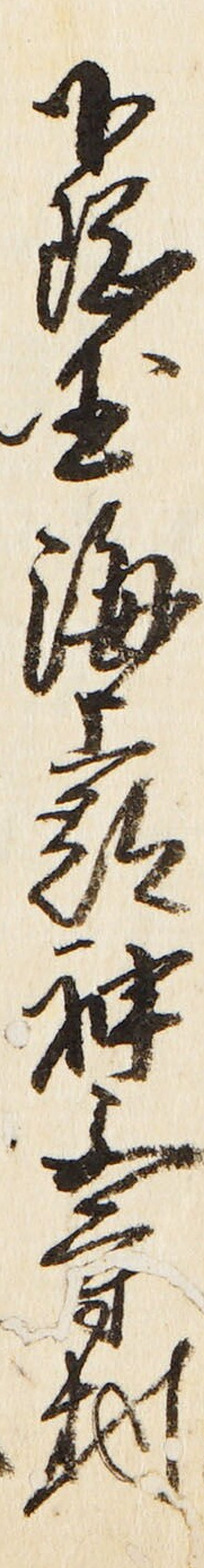下総国海上郡神宮寺村
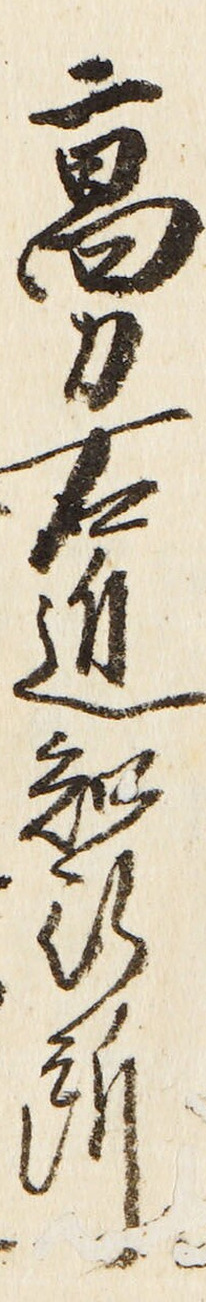高力右近知行所
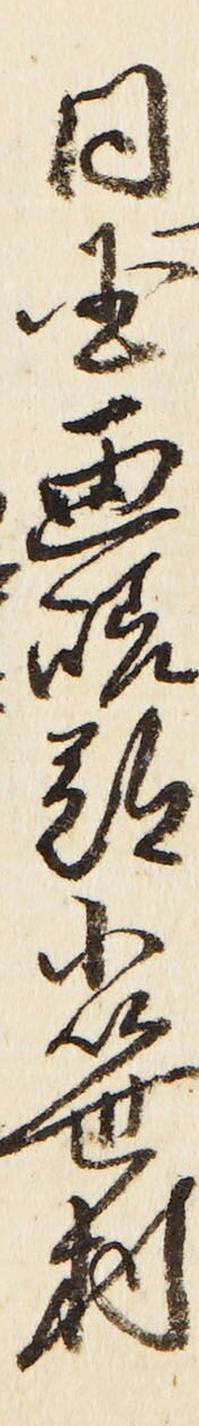同国匝瑳郡小笹村

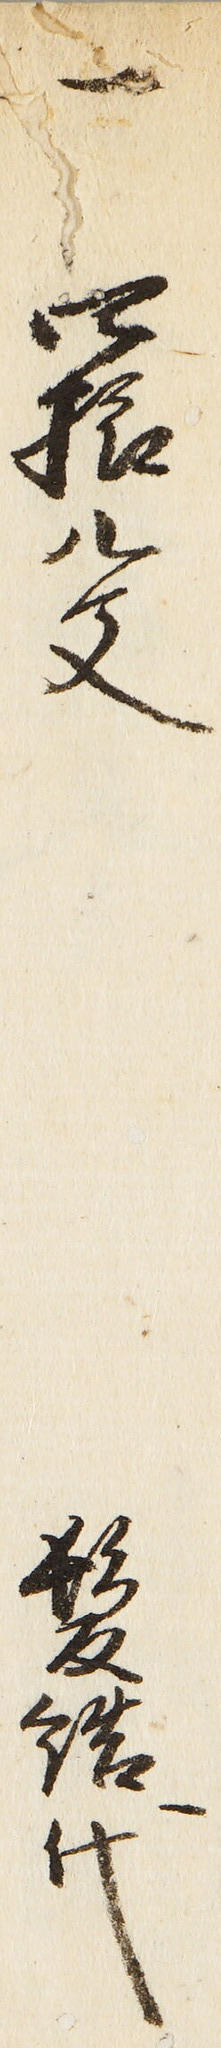一四拾八文髪結代
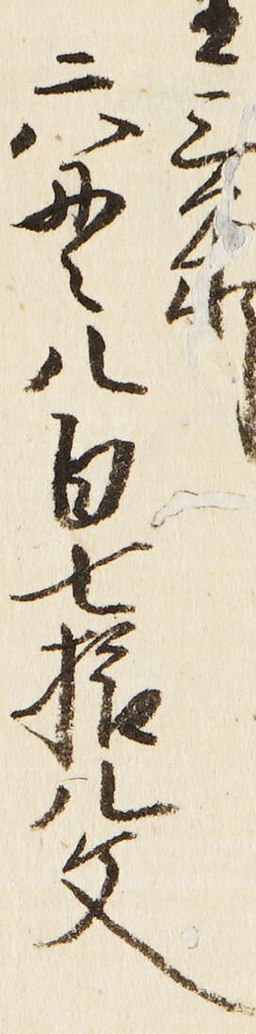六貫八百七拾八文
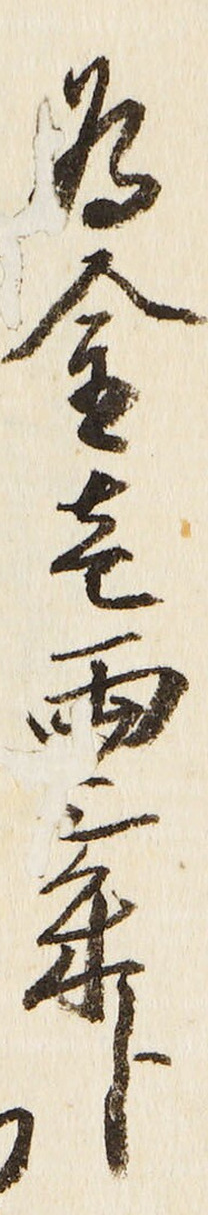為金壱両三朱ト
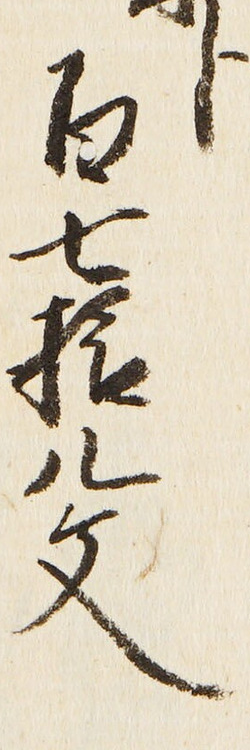百七拾八文
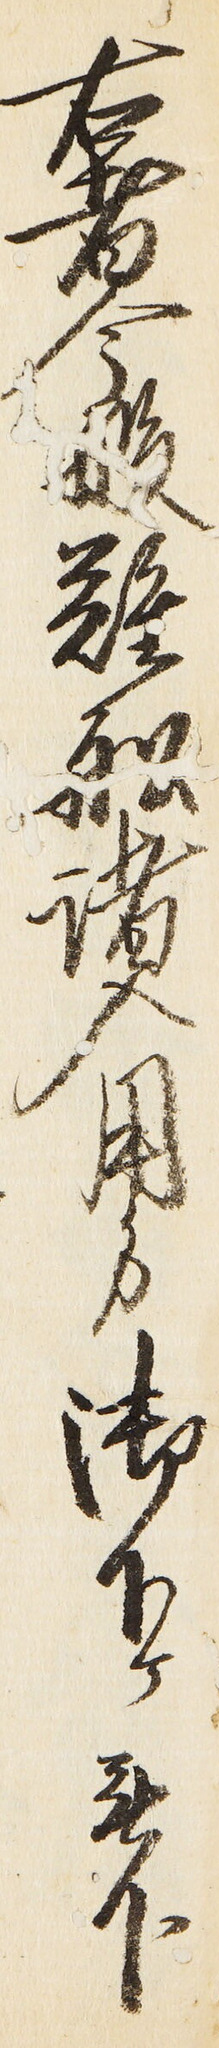右者今般難船諸入用方御下ケ被下
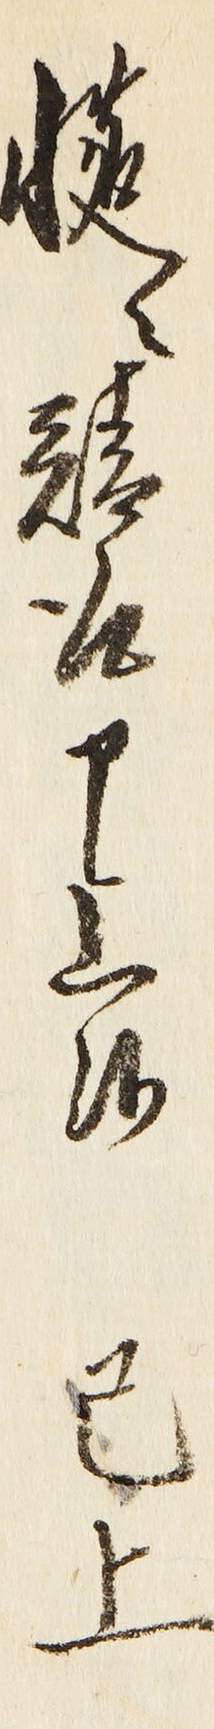慥ニ請取申上候已上
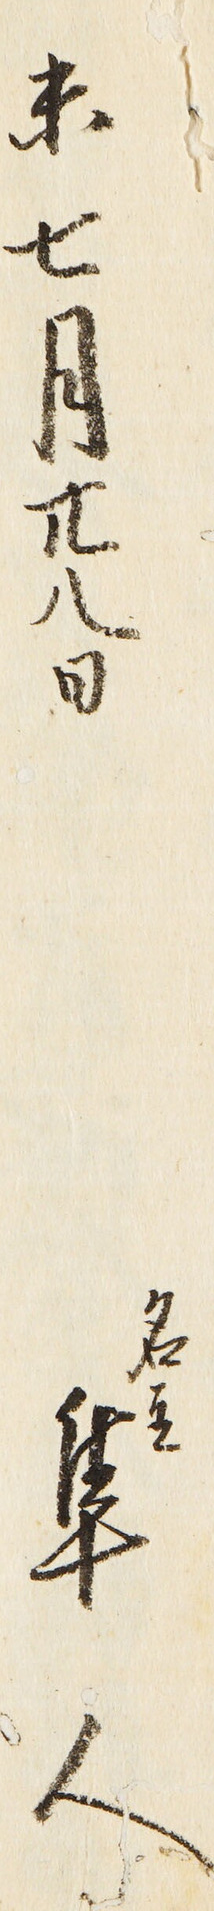未七月廿八日神宮寺村
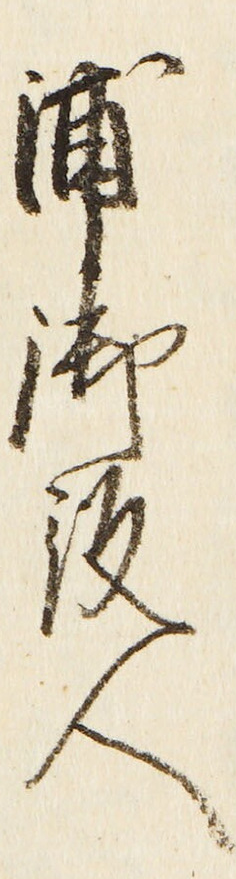浦御役人
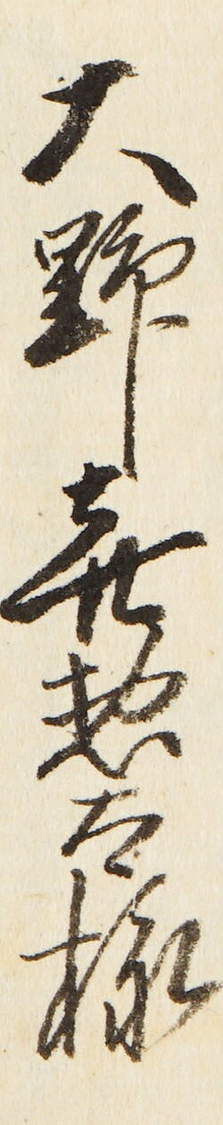大野喜惣太様

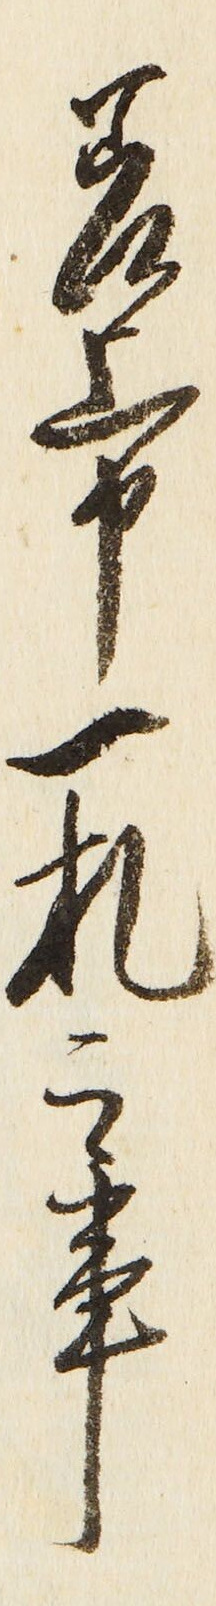差上申一札之事
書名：難船一件記録
